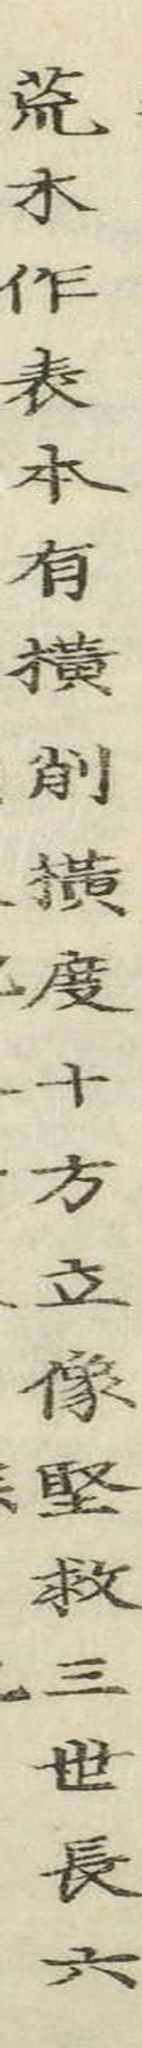荒木作表本有横削横度十方立像堅救三世長六
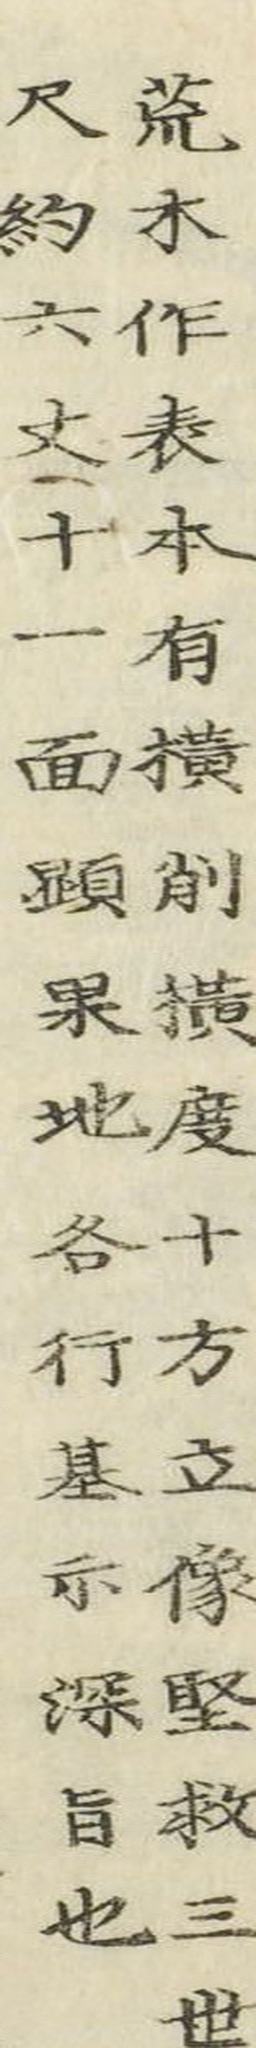尺約六丈十一面顕果地各行基示深旨也
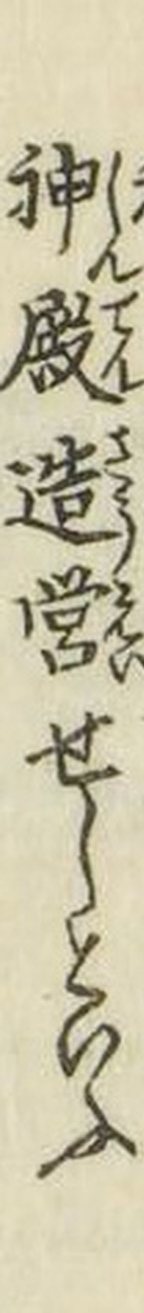神殿造営せしといふ
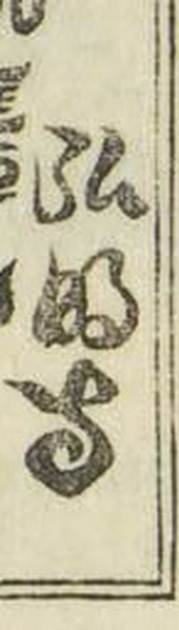弘明寺
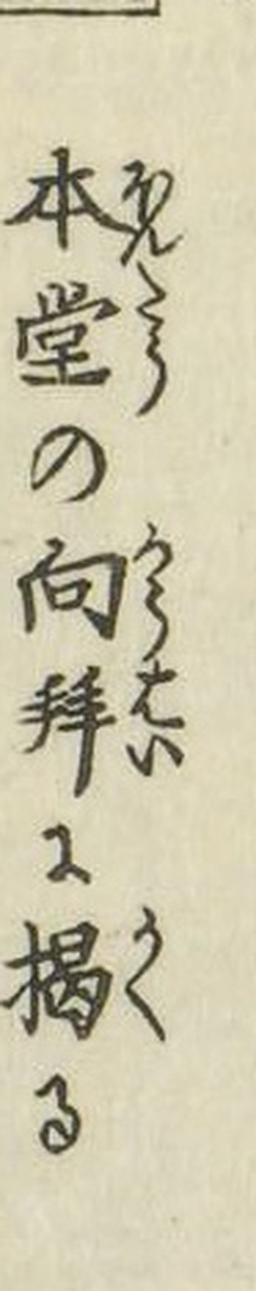本堂の向拜に掲る
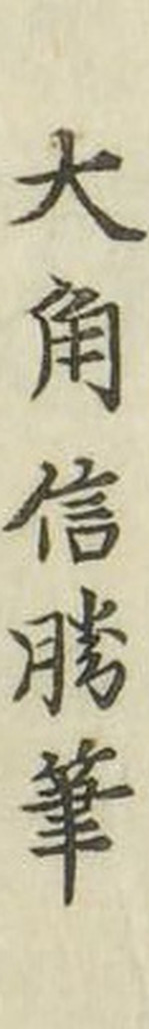大角信勝筆

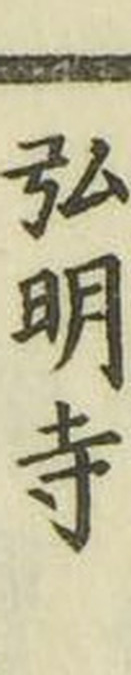弘明寺

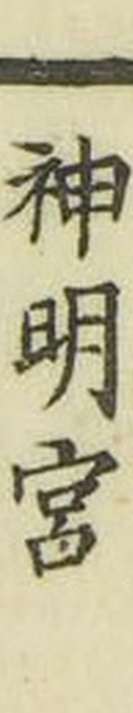神明宮
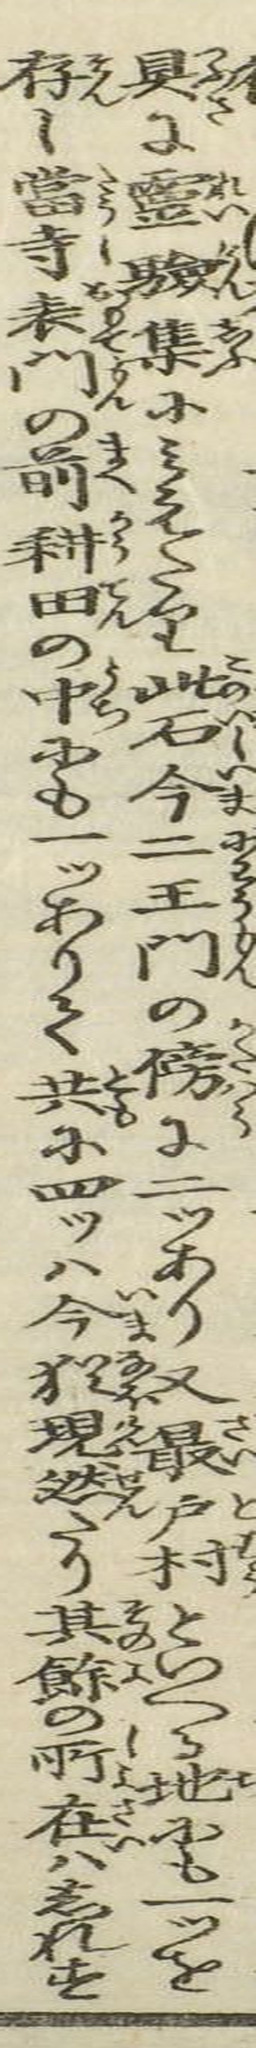存し當寺表門の前耕田の中にも一ッありて共に四ッは今猶現然たり其餘の所在はしれすといふ
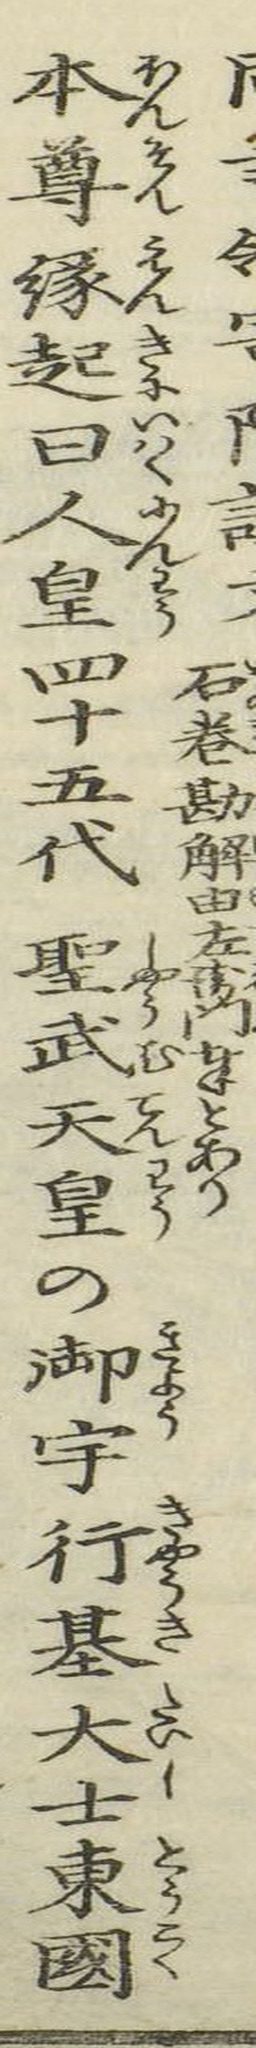本尊縁起曰人皇四十五代聖武天皇の御宇行基大士東國
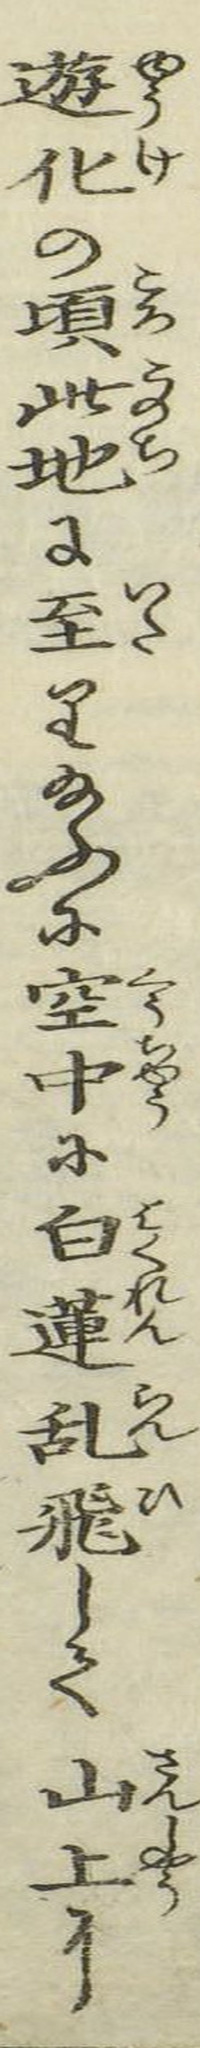遊化の頃此地に至り給ふに空中に白蓮乱飛して山上に
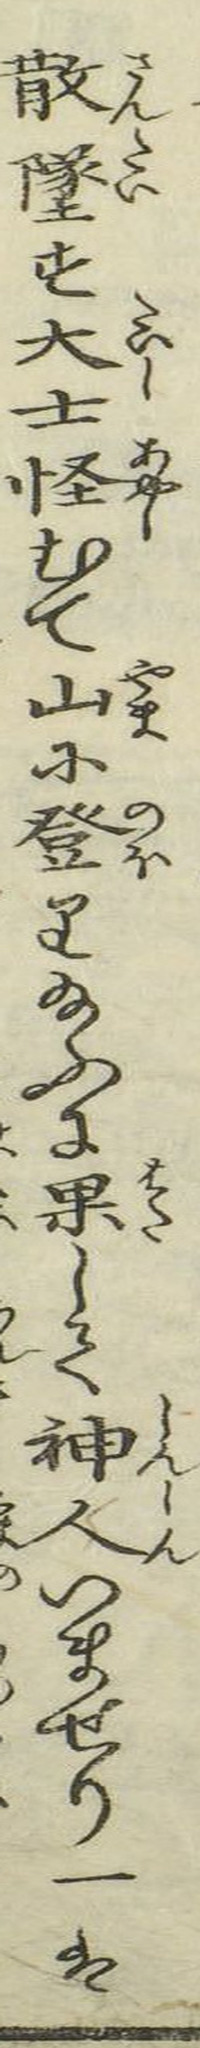散墜す大士怪むて山に登り給ふに果して神人いませり一は
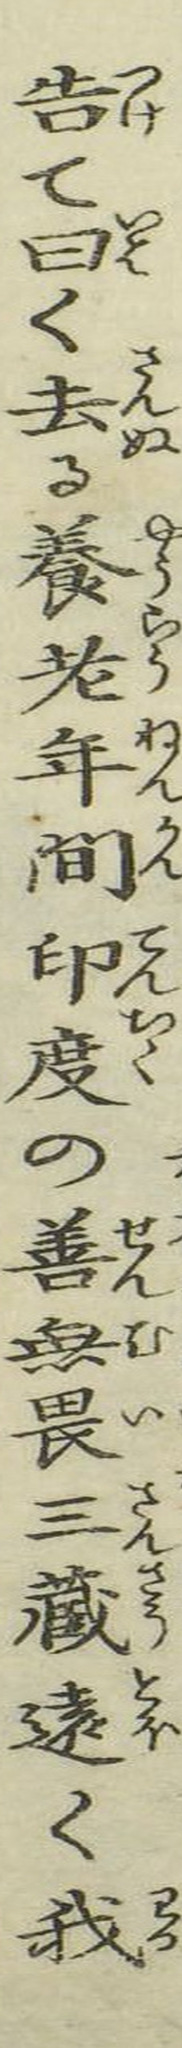告て曰く去る養老年間印度の善無畏三蔵遠く我

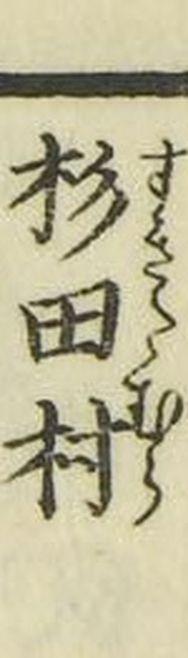杉田村
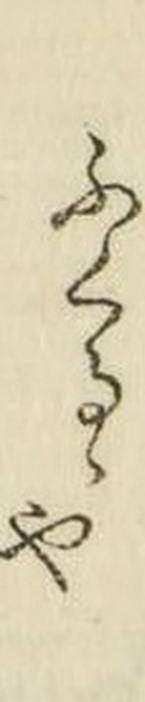ふくるゝや
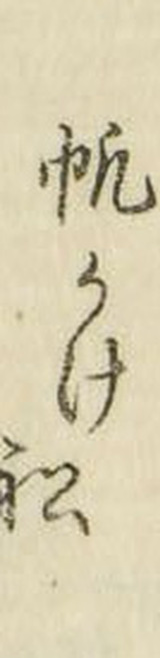帆かけ舩
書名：江戸名所図会 20巻 巻之6
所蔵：東京学芸大学教育コンテンツアーカイブ
